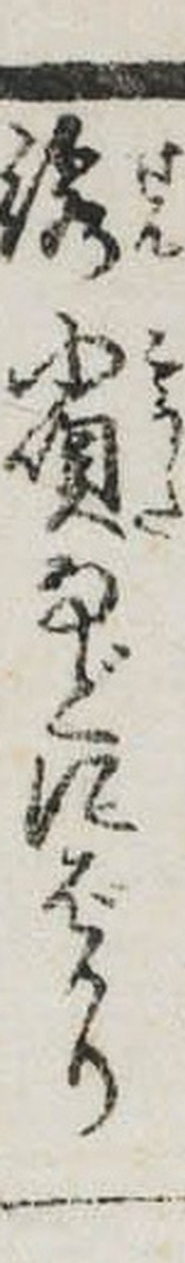線小唄などにばかり
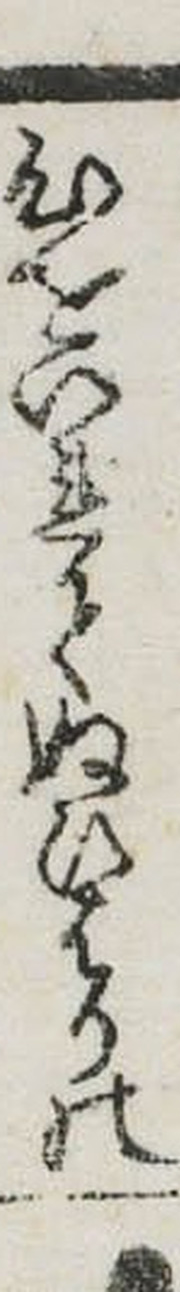心をいれてぬひはりの
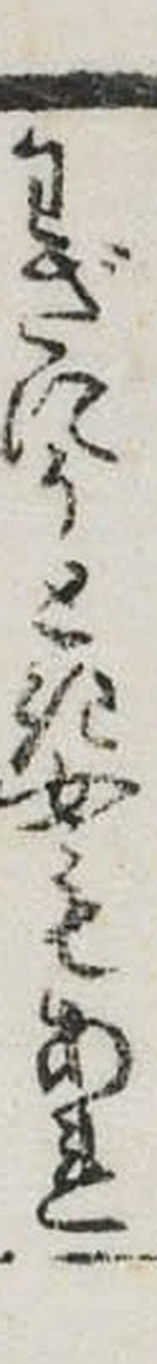わざにうとき女もあれ
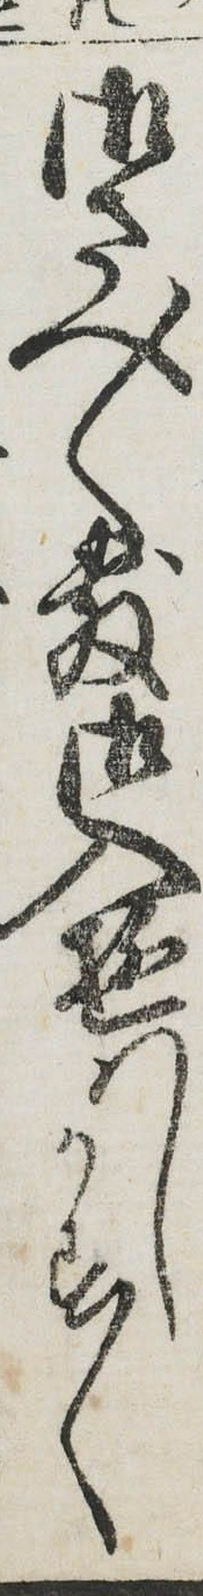御さへ〳〵敷御入遊はしかす〳〵
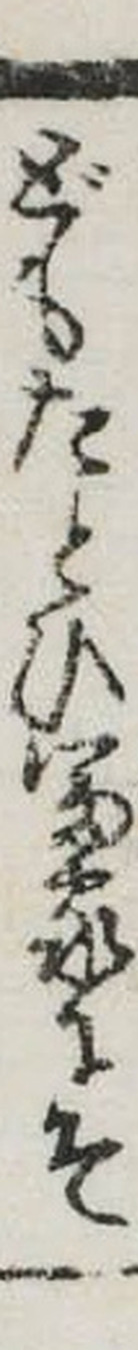どもたとひ富家にそ
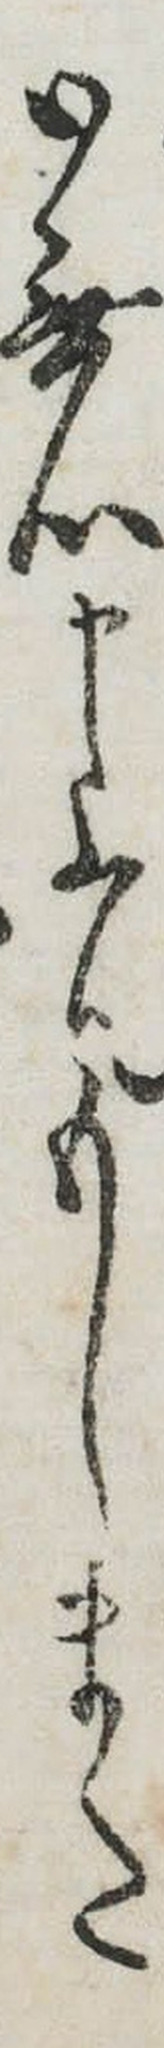御無心申上候もしまた
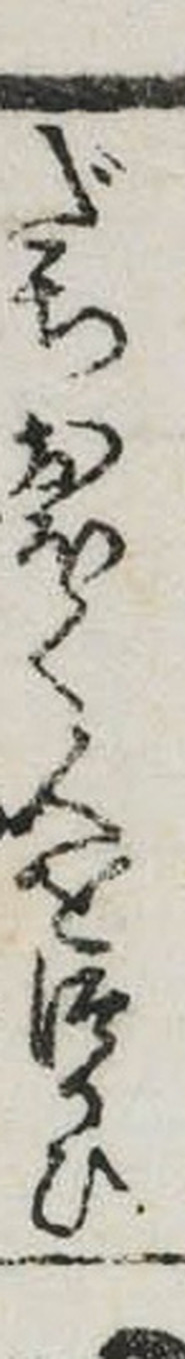だちおほく人をつかひ
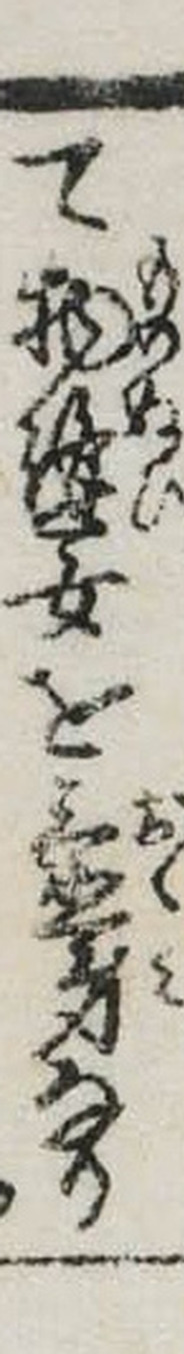て物縫女を置身なり
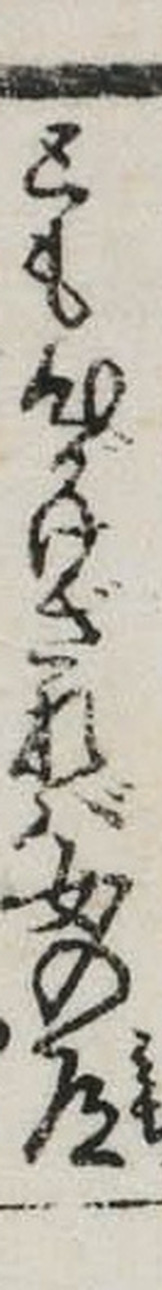とも心がけざれば女の道
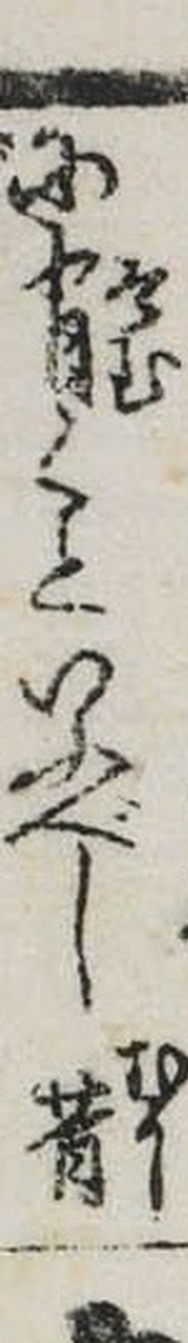に背くといふべし昔
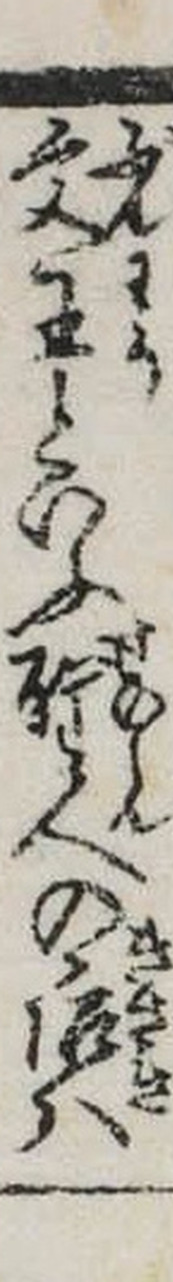文王といふ聖人の后は
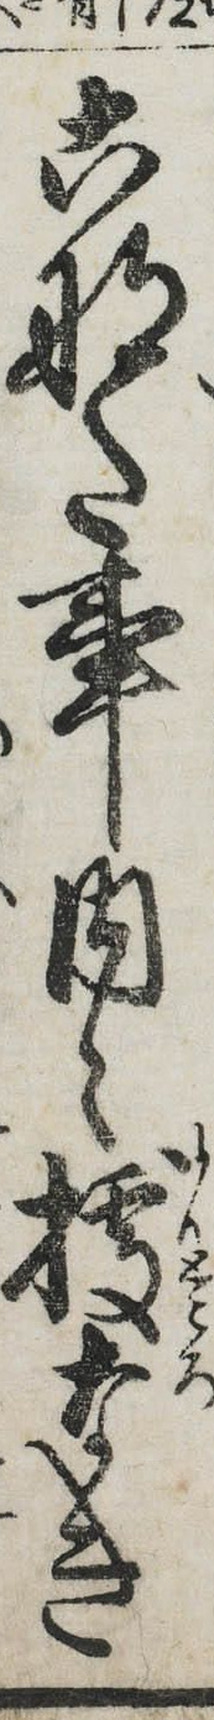こなた事内々拠なき
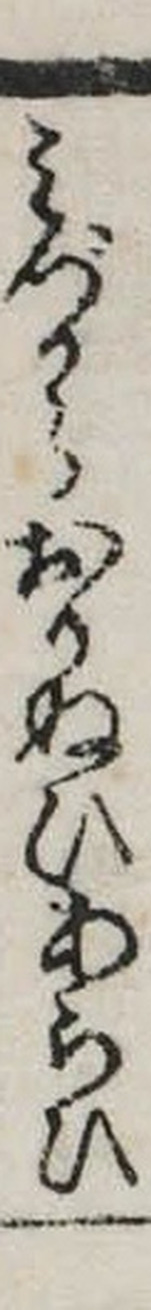みづからおりぬひあらひ
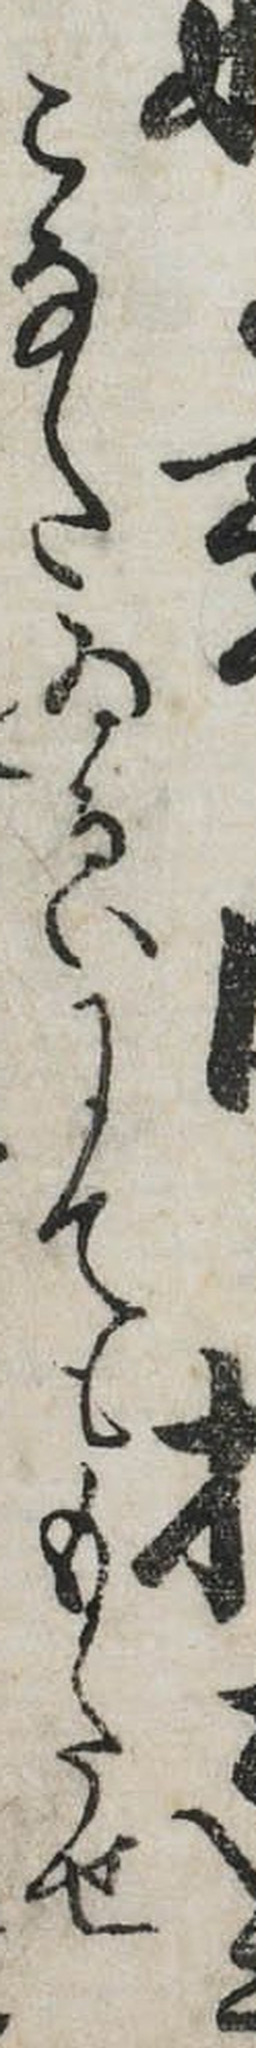こなたゐるいにてももたせ
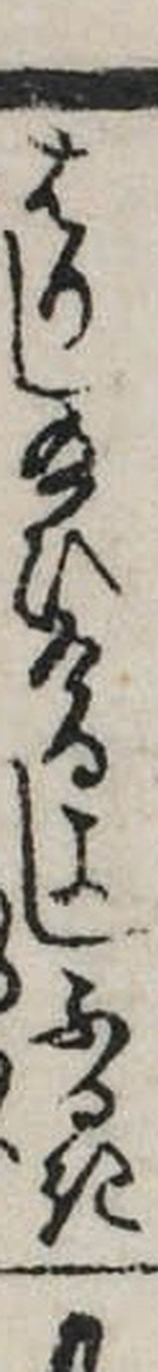はりし給ひけるよしふるき
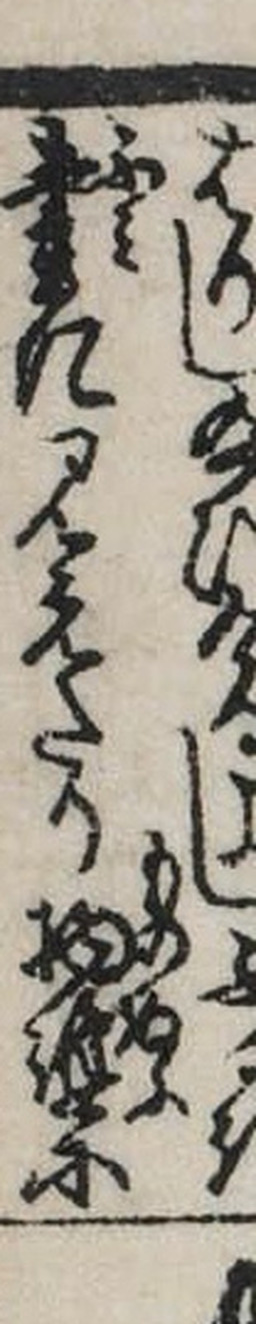書に見えたり物縫に
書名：頭書萬用婦人手紙之文言
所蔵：東京学芸大学教育コンテンツアーカイブ
